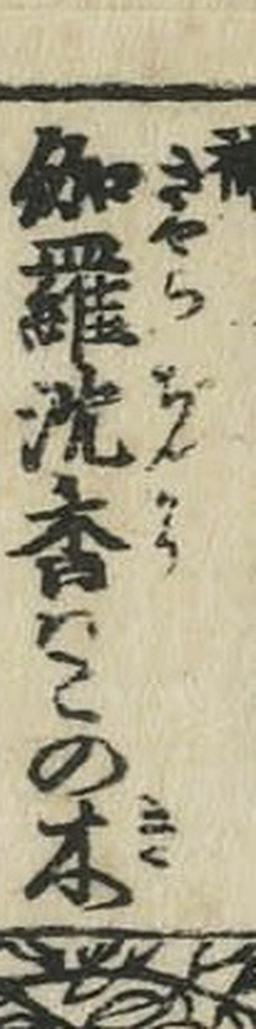伽羅沈香はこの木
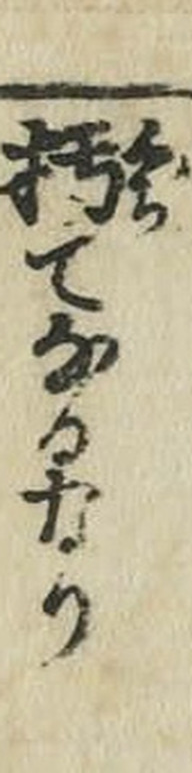朽てなるなり
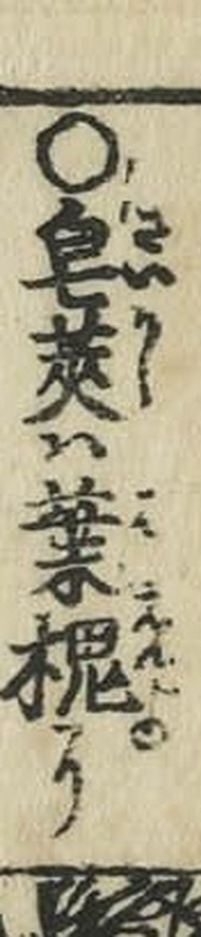○皂莢は葉槐に
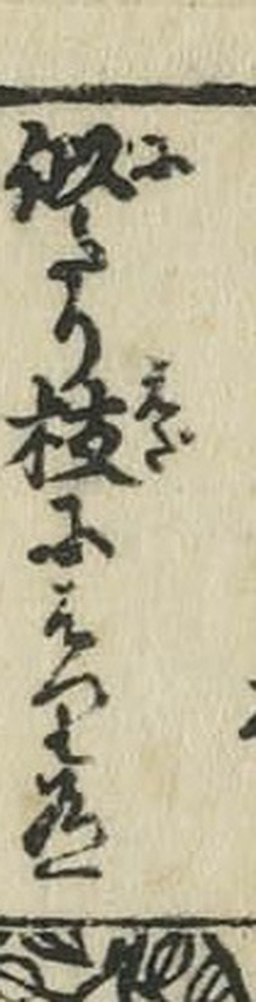似たり枝にはり有
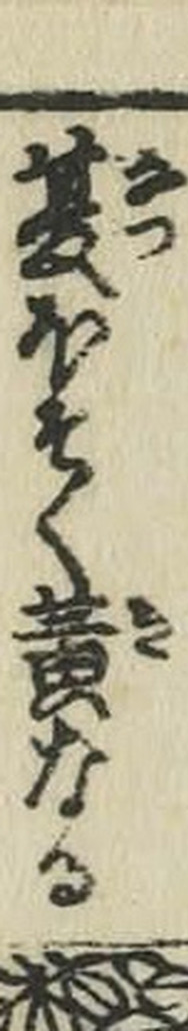夏ほそく黄なる
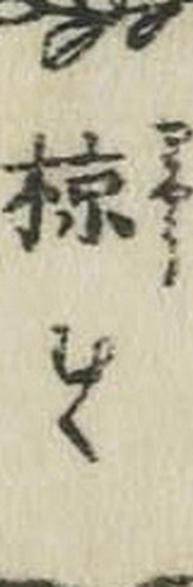椋むく
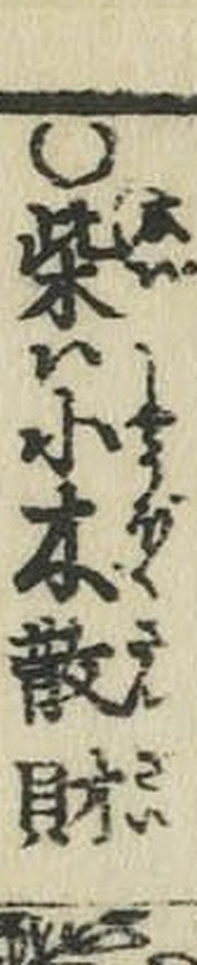○柴は小木散財
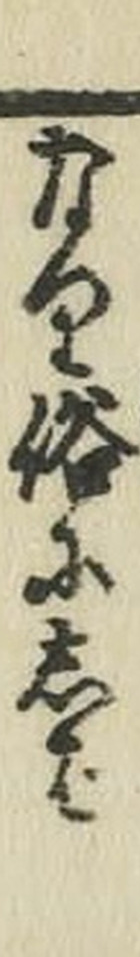なり俗にしば
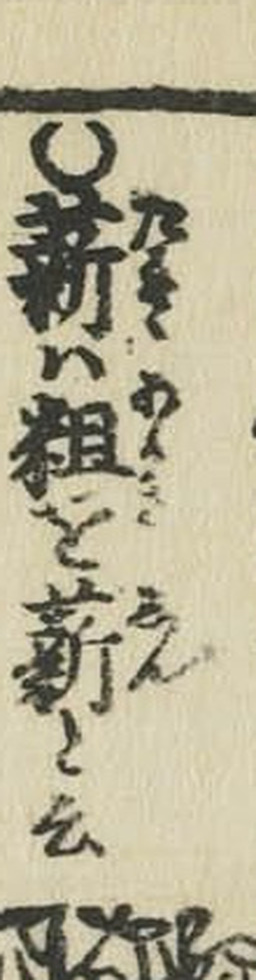○薪は粗を薪と云
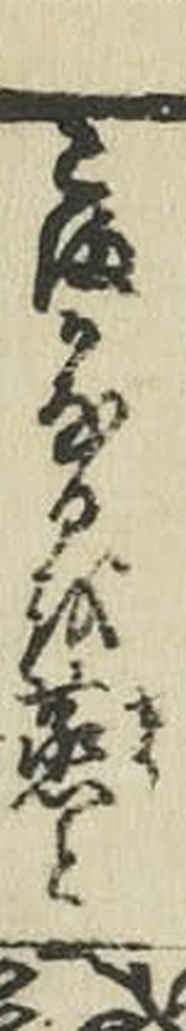こまかなるを蒸と
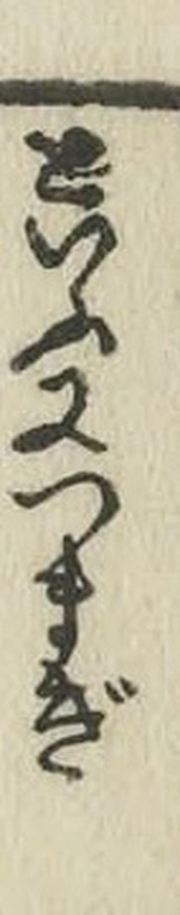といふ又つまぎ
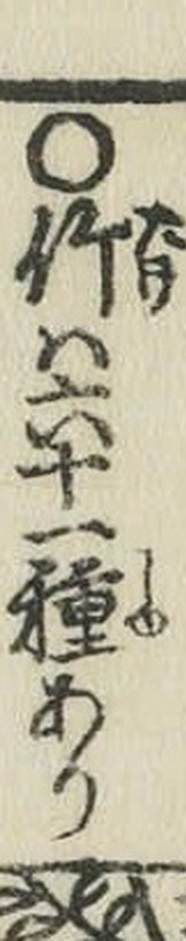○竹は六十一種あり
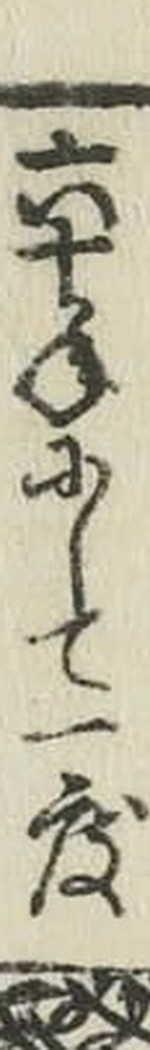六十年にして一度
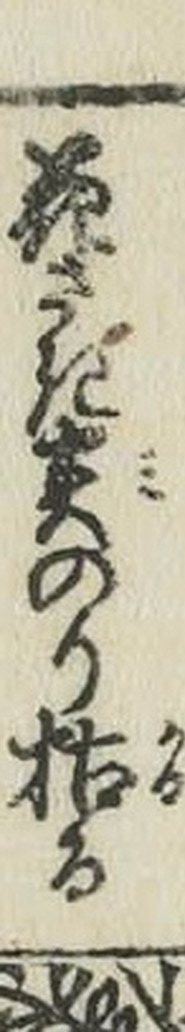花さき実のり枯る
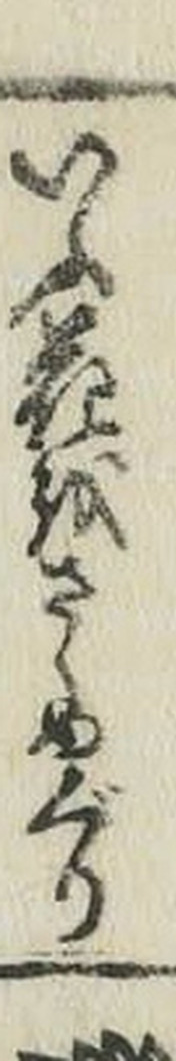いふ花をさゝめぐり
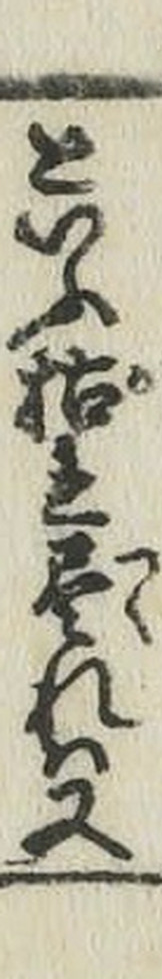といふ枯れ尽れは又
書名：増補頭書訓蒙図彙大成 10巻 8:巻之17-19
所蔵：東京学芸大学教育コンテンツアーカイブ
